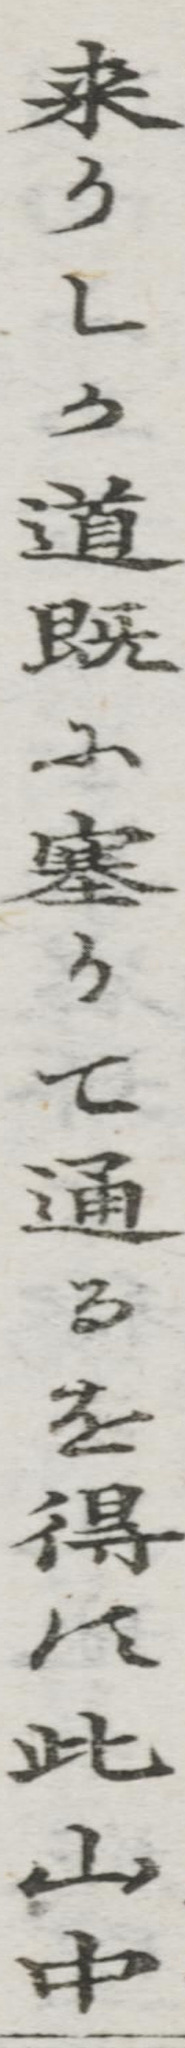来りしか道既に塞りて通るを得す此山中
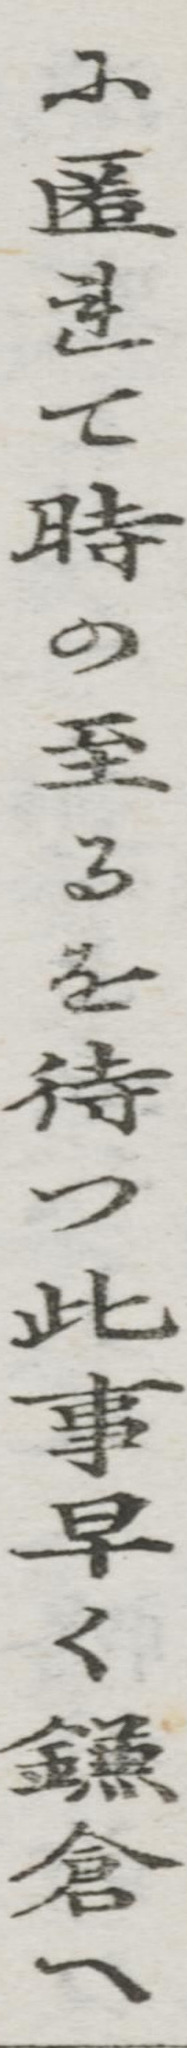に匿れて時の至るを待つ此事早く鎌倉へ
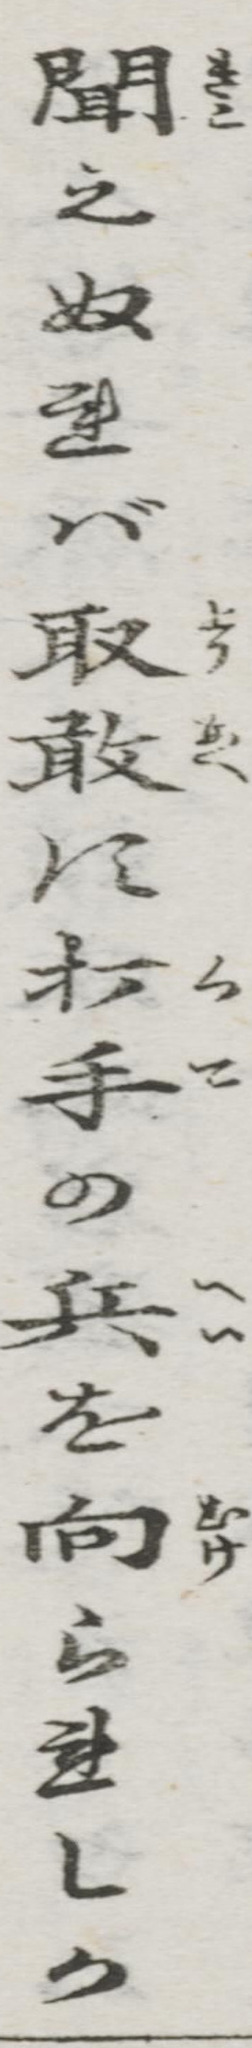聞えぬれば取敢す打手の兵を向られしか
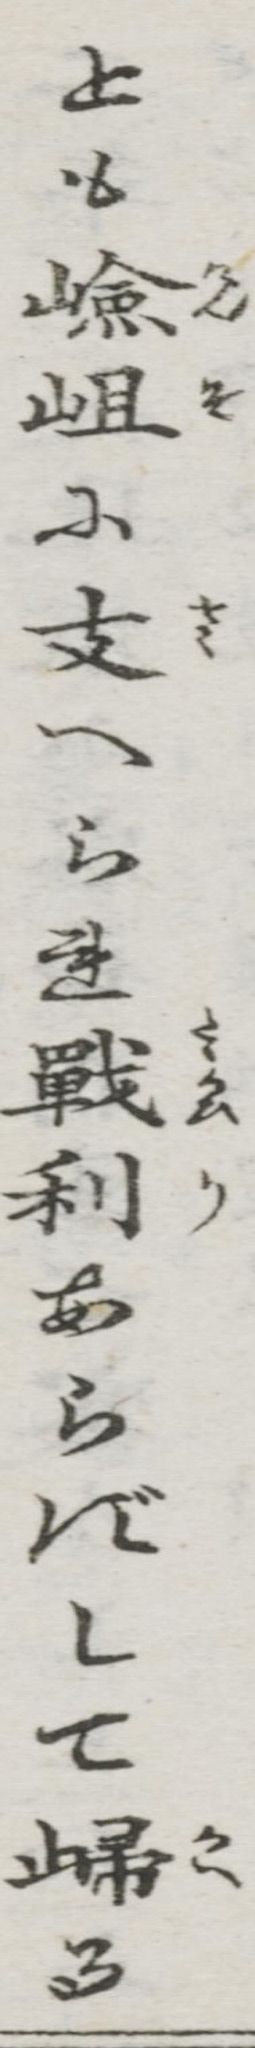とも嶮岨に支へられ戦利あらずして歸る
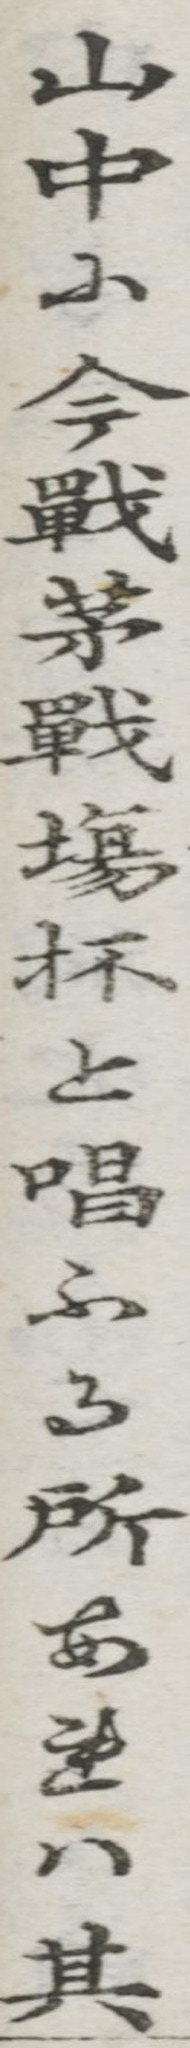山中に今戦茅戦場抔と唱ふる所あれは其
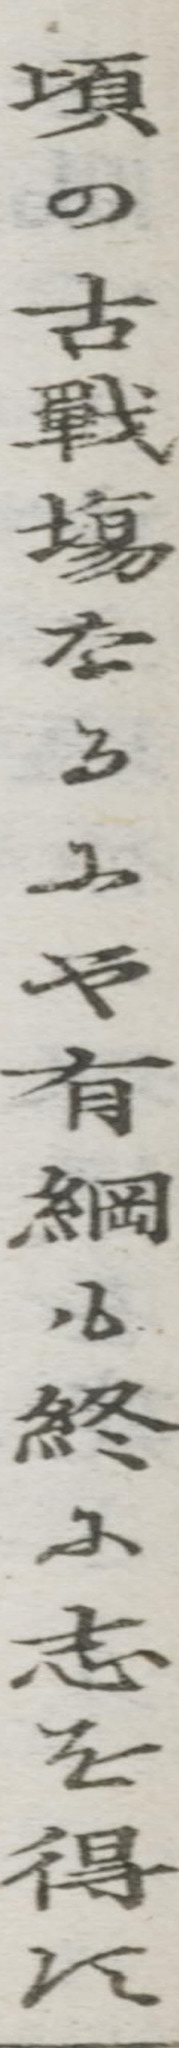頃の古戦場なるにや有綱も終に志を得す
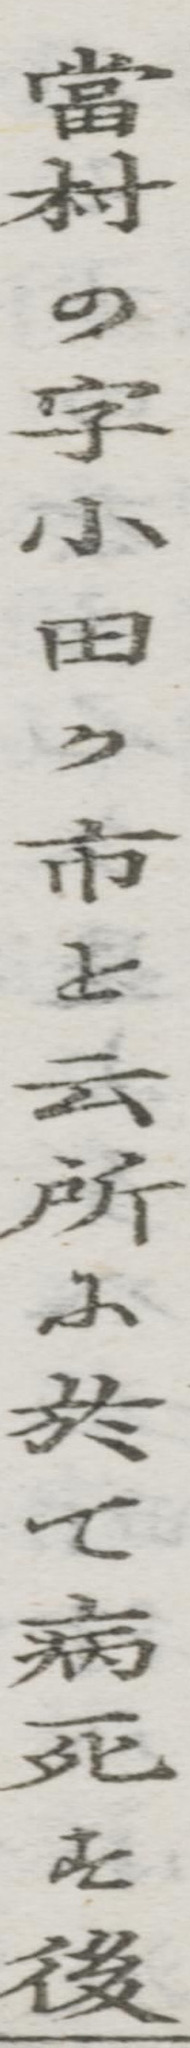當村の字小田ヶ市と云所に於て病死す後
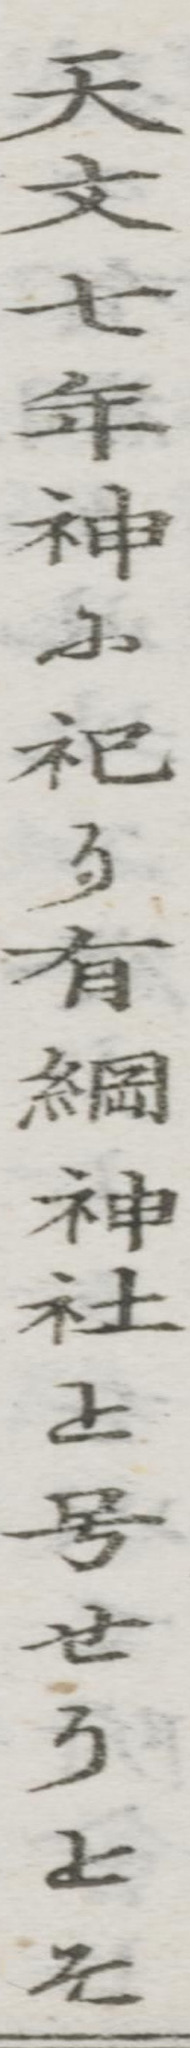天文七年神に祀り有綱神社と号せりとそ
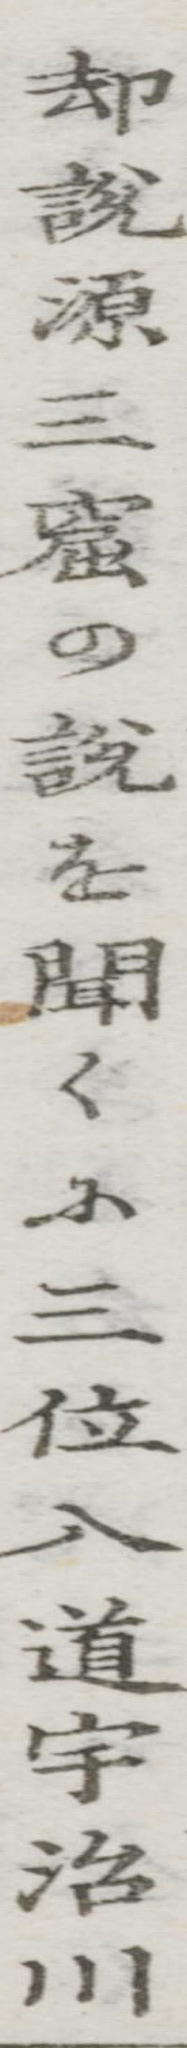却説源三窟の説を聞くに三位入道宇治川
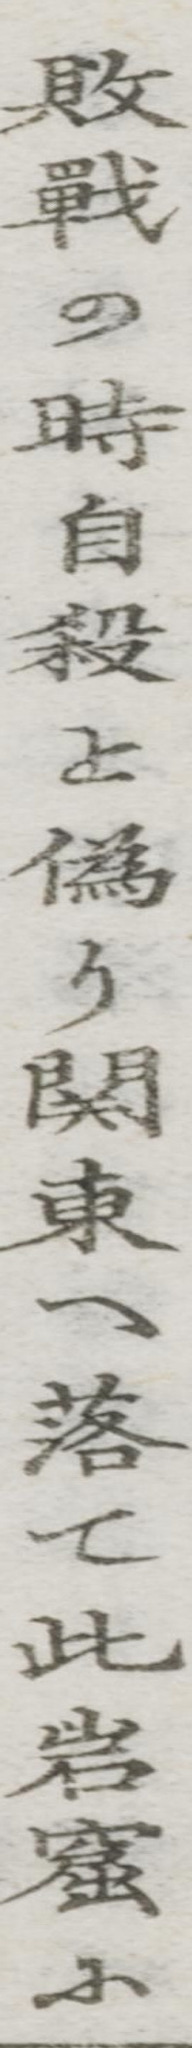敗戦の時自殺と偽り関東へ落て此岩窟に
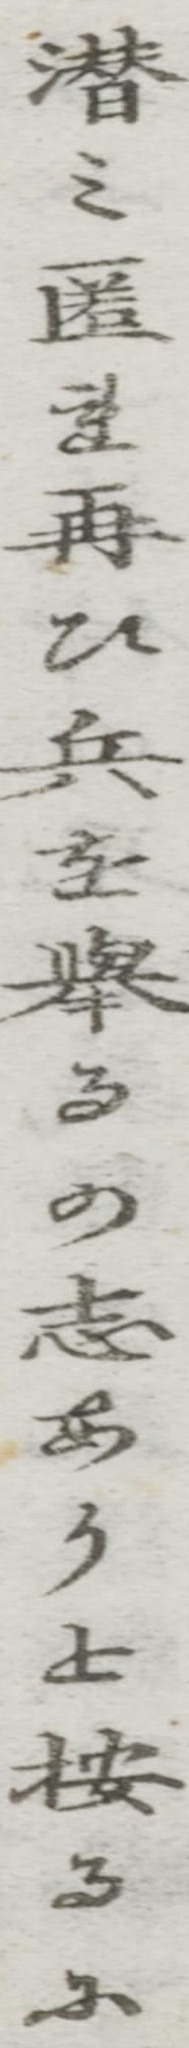潜み匿れ再ひ兵を擧るの志ありと按るに
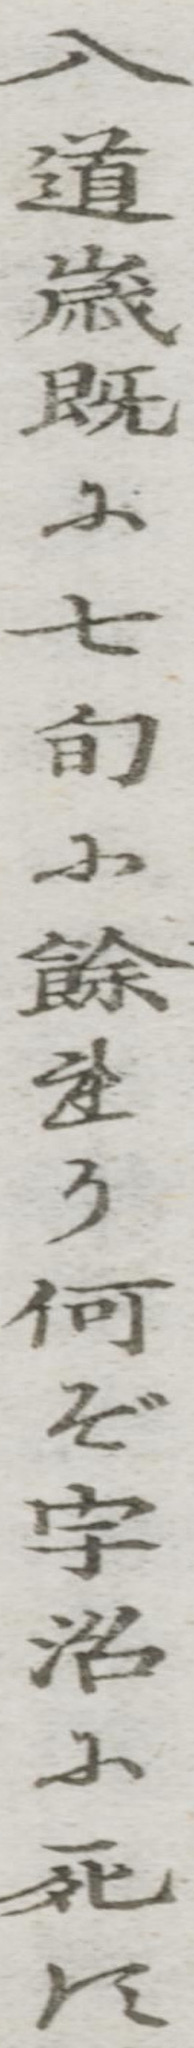入道歳既に七旬に餘れり何ぞ宇治に死す
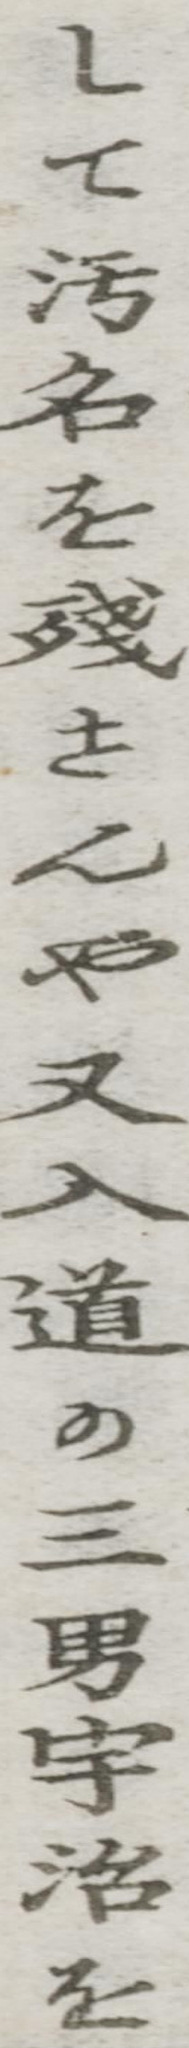して汚名を殘さんや又入道の三男宇治を

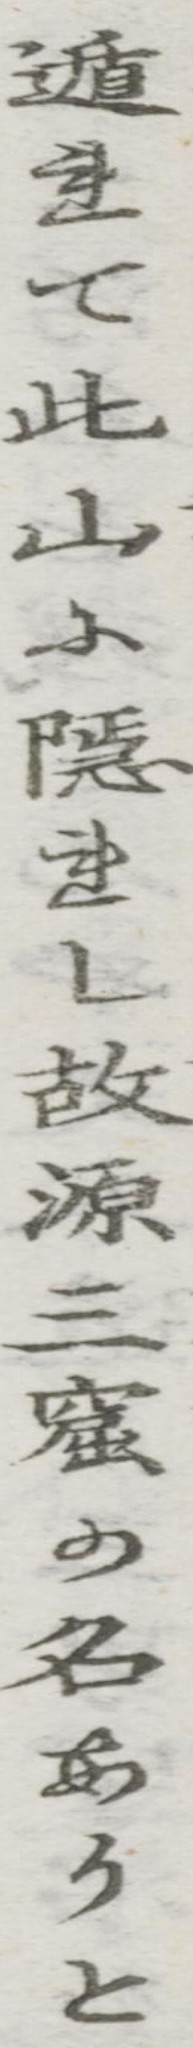遁れて此山に隠れし故源三窟の名ありと
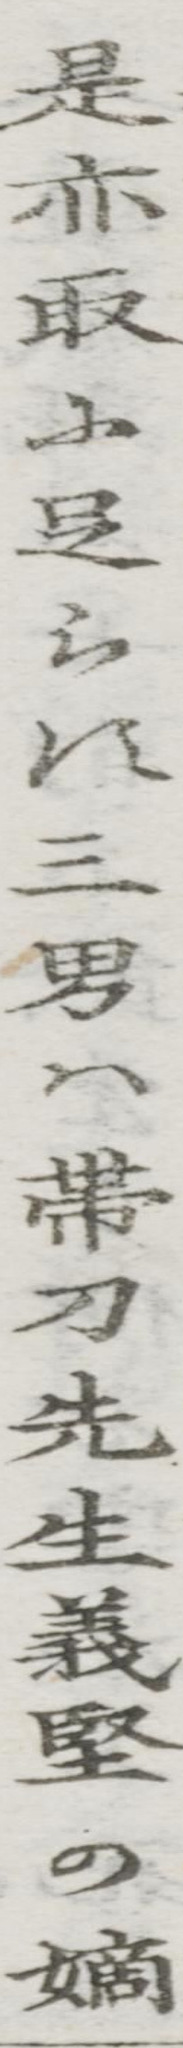是亦取に足らす三男は帯刀先生義堅の嫡
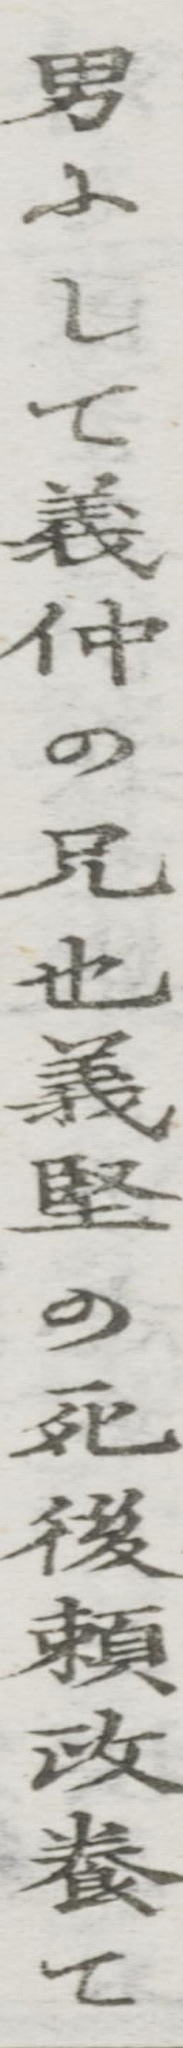男にして義仲の兄也義堅の死後頼政養て
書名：塩原繁昌記　全
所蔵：東京大学地震研究所図書室 Earthquake Research Institute Library, The University of Tokyo, JAPAN
